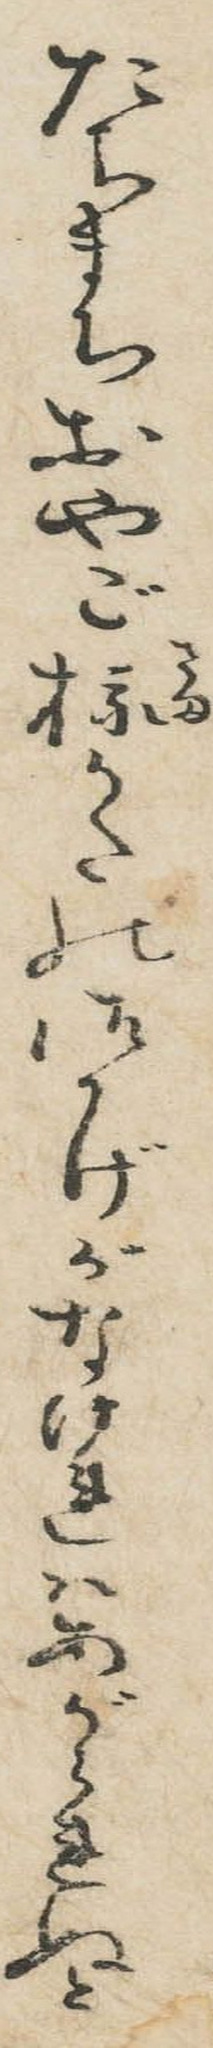たちまちおやご様かたの御かげがなけれはあがられぬと
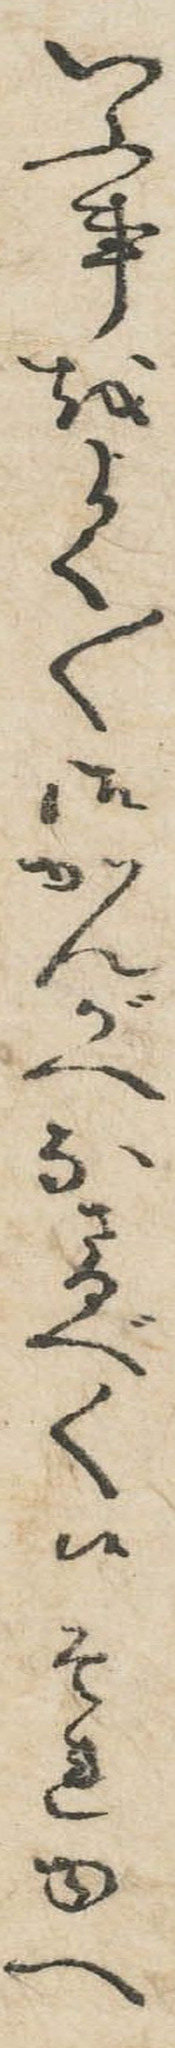いふ事をよく〳〵御かんがへなさるべく候それゆへ
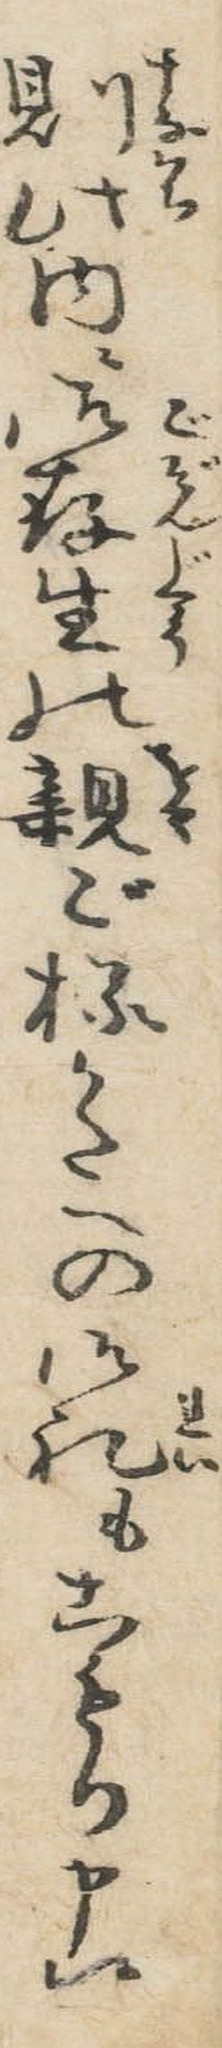則此内に御存生の親ご様かたへの御礼もこもり申候
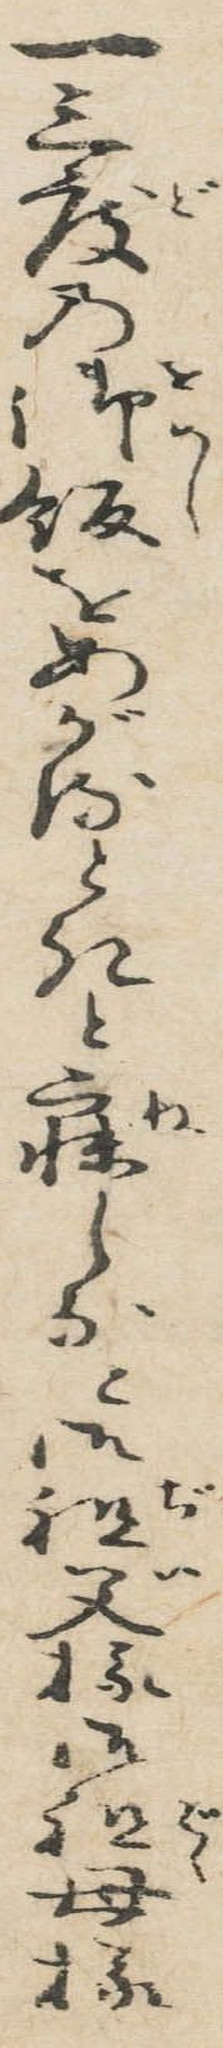一三度乃御飯をあがるときと寝しなに御祖父様御祖母様
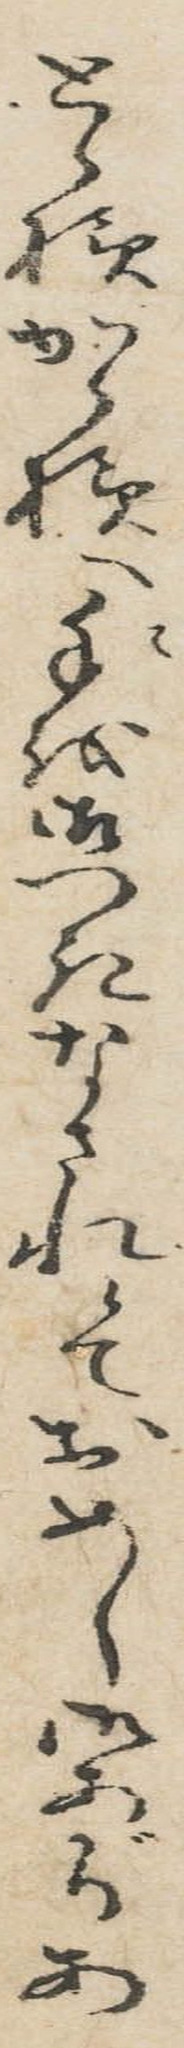とゝ様かゝ様へ手を御つきなされ候ておめし御あがりあ
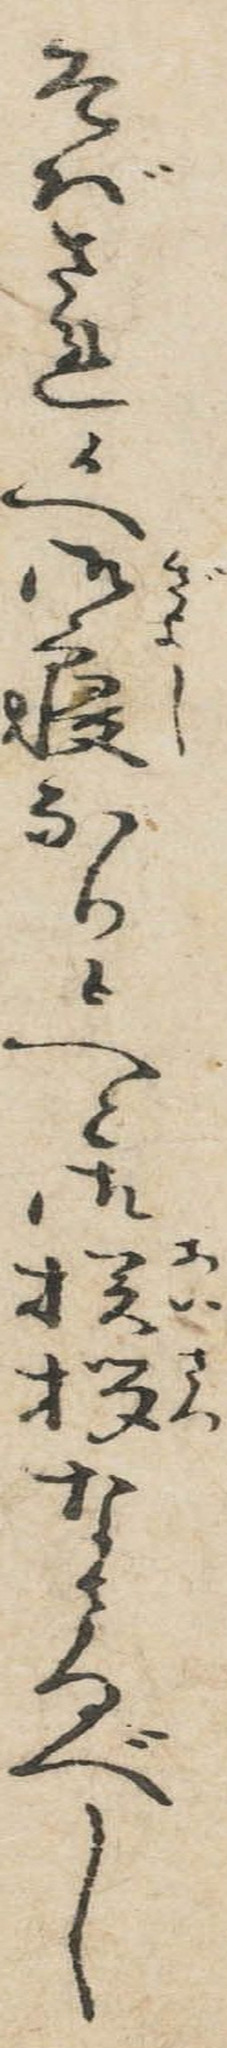そばされ候へ御寝なり候へと御挨拶なさるべし
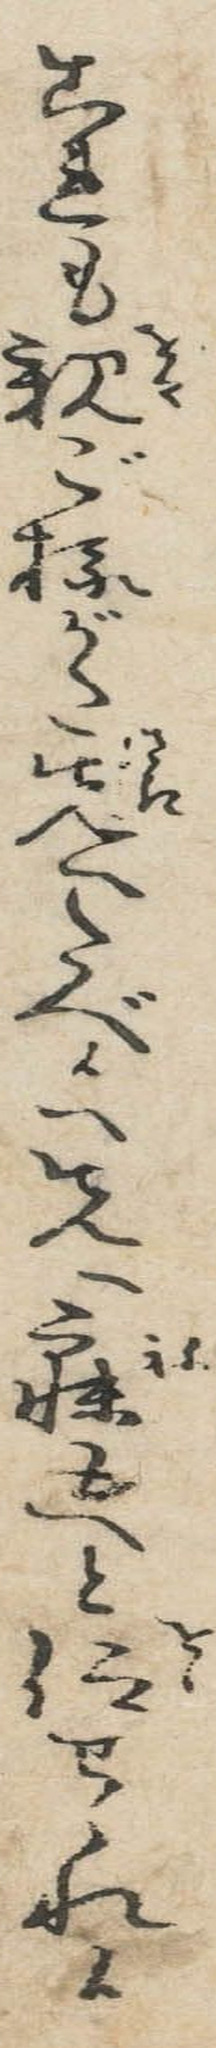これも親ご様がた先へたべ候へ先へ寝候へと仰せられ候
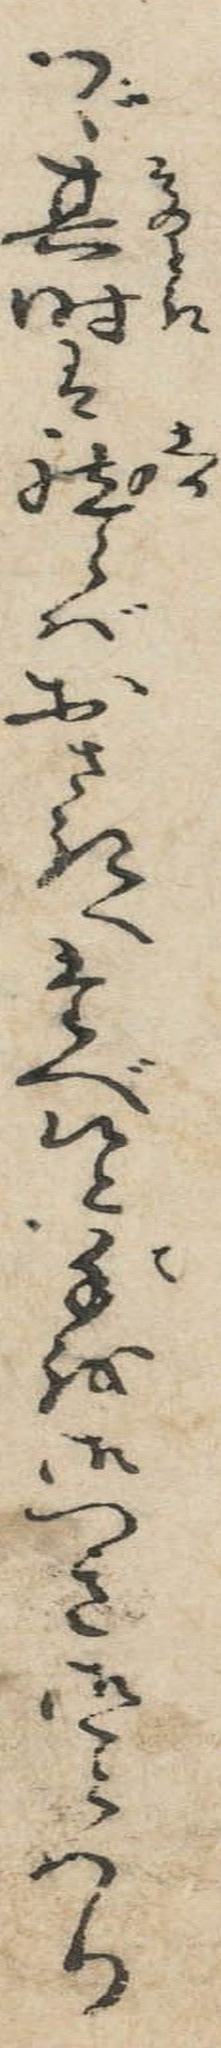はゞ其時は然らばおさきへたべ候と手を御つき御ことわり
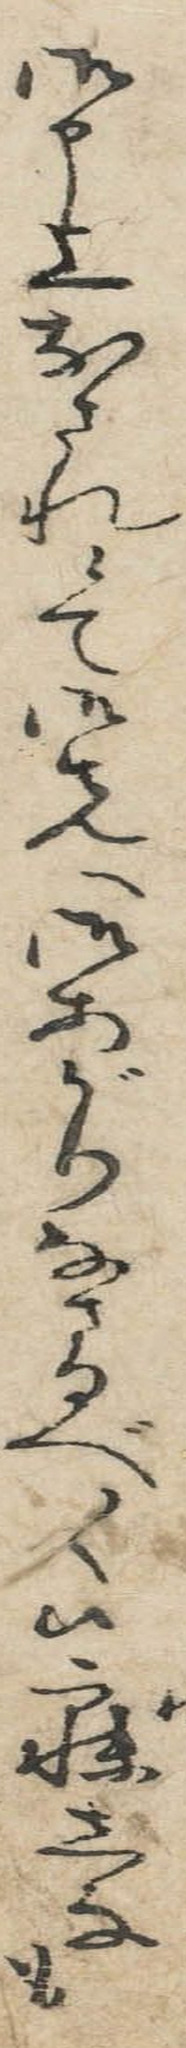御申上なされ候て御先へ御あがりなさるべく候寝しなも
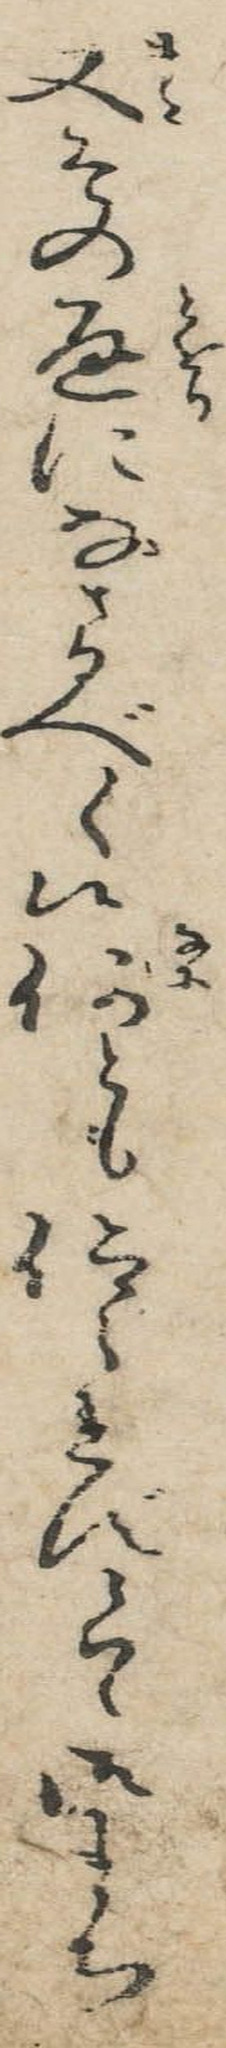又その通になさるべく候何とも仰られず候はゝ御まち
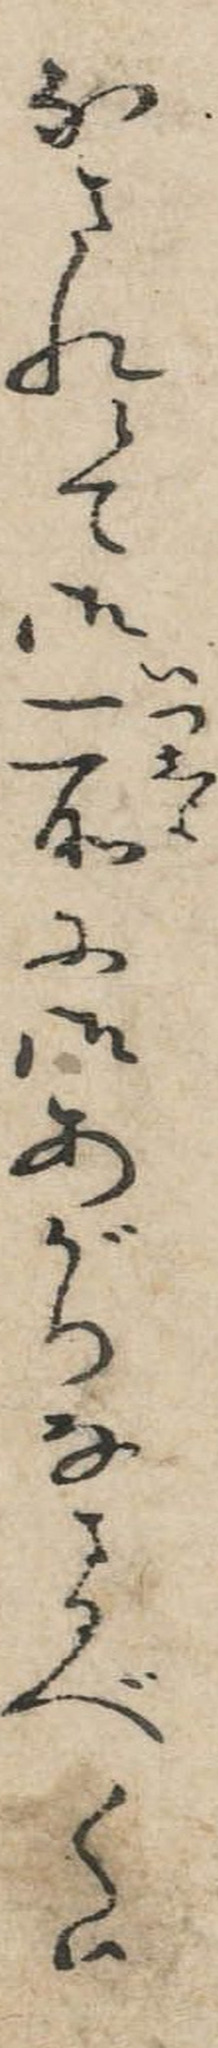なされ候て御一所に御あがりなさるべく候
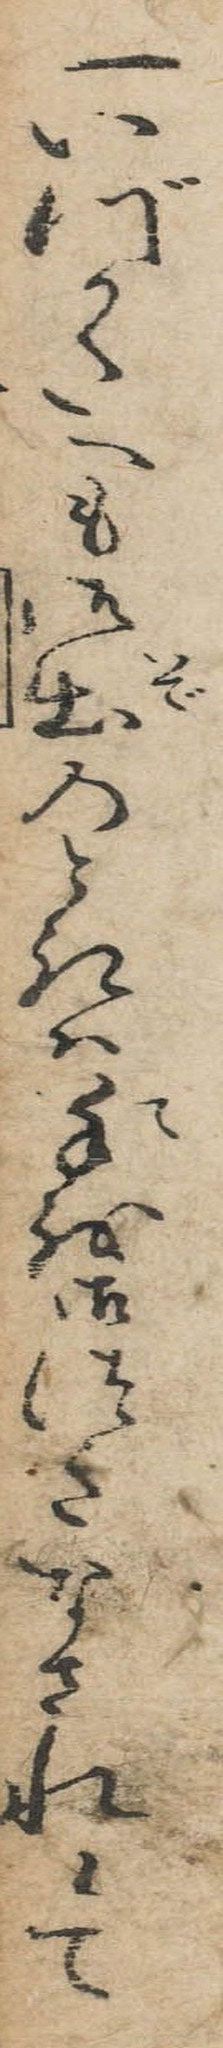一いづかたへも御出のときは手を御つきなされ候て

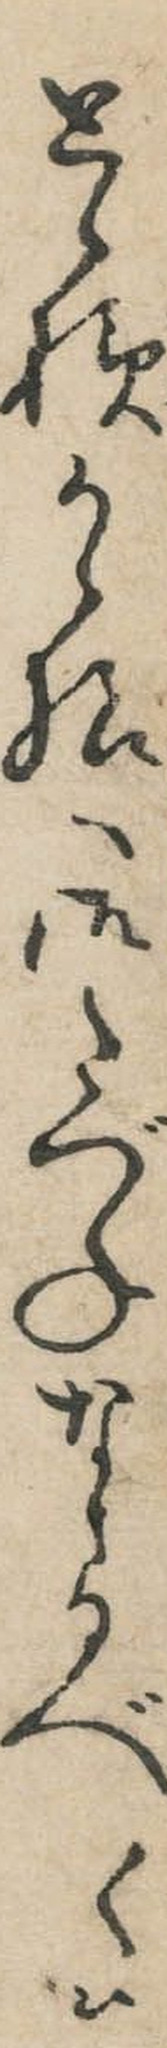とゝ様かゝ様へ御たづねなさるべく候
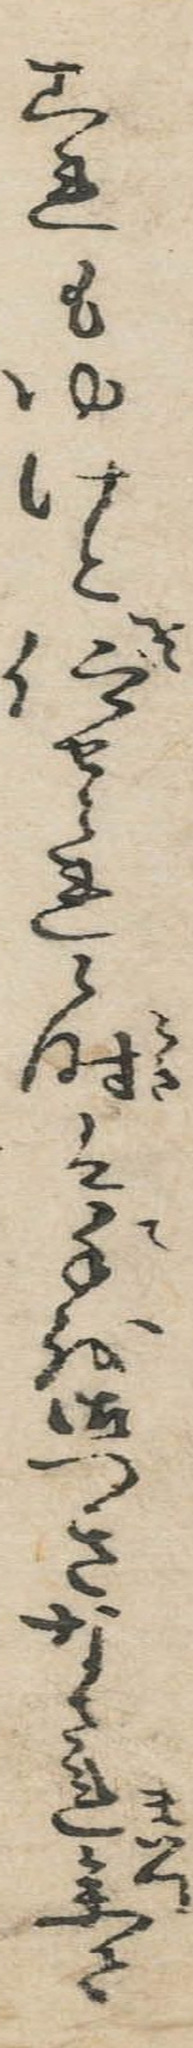これもゆけと仰せられ候時は手を御つきなされ参て
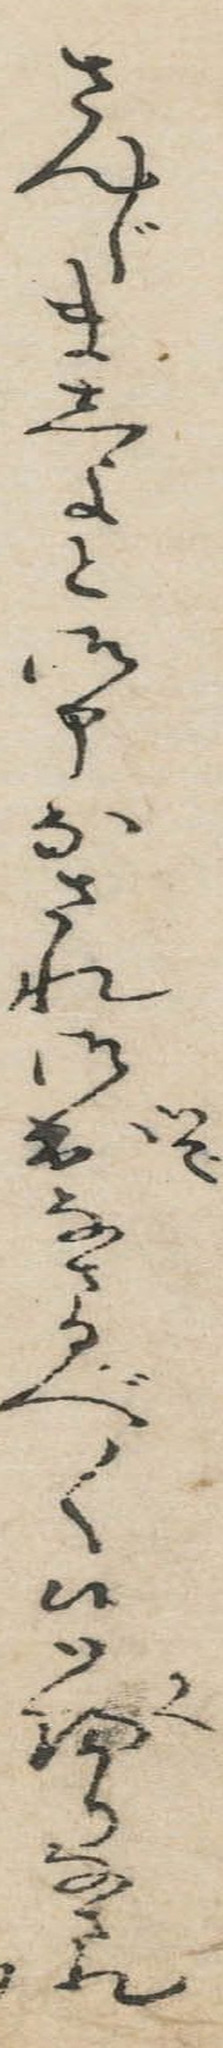さんじましよと御申なされ御出なさるべく候御帰りなされ候
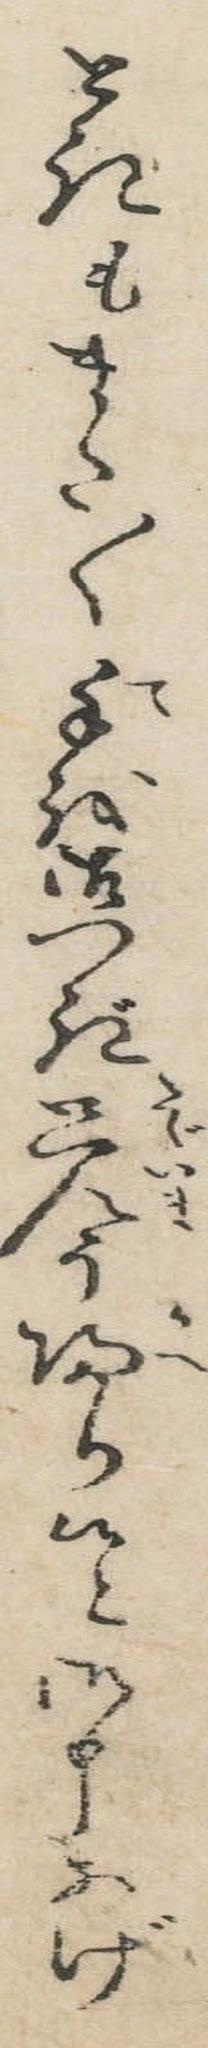ときもまた〳〵手を御つぎ只今帰り候と御申あげ
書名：前訓
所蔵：東京学芸大学附属図書館
